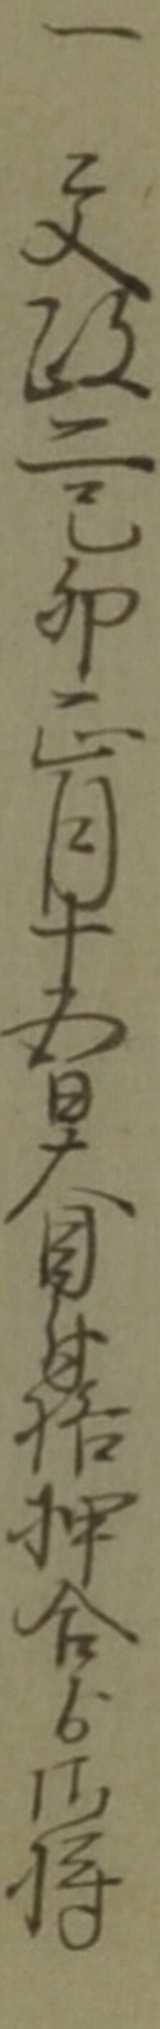一文政二己卯正月十五日大目付格押合ゟ御持
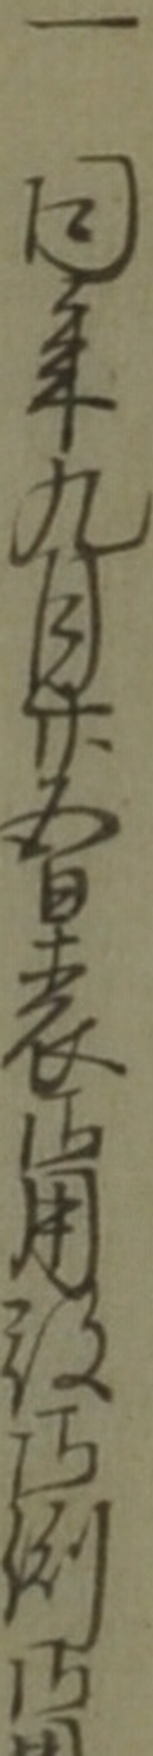一同年九月廿五日表御用役御側御用役
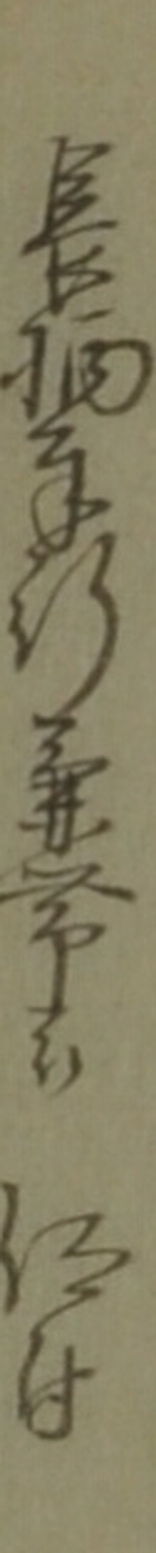長柄奉行兼帯被仰付
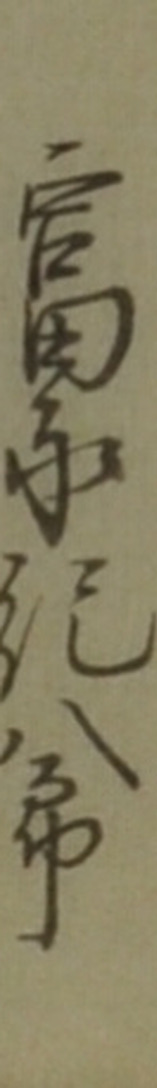富永紀八郎
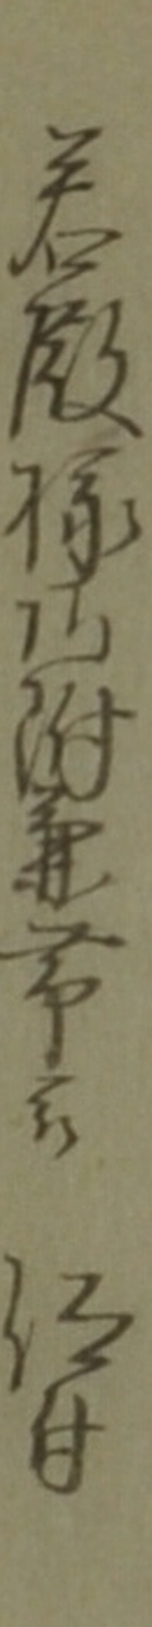若殿様御附兼帯被仰付
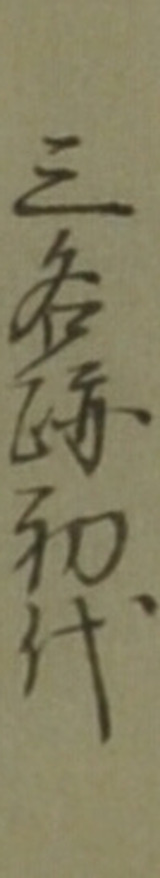三名跡初代
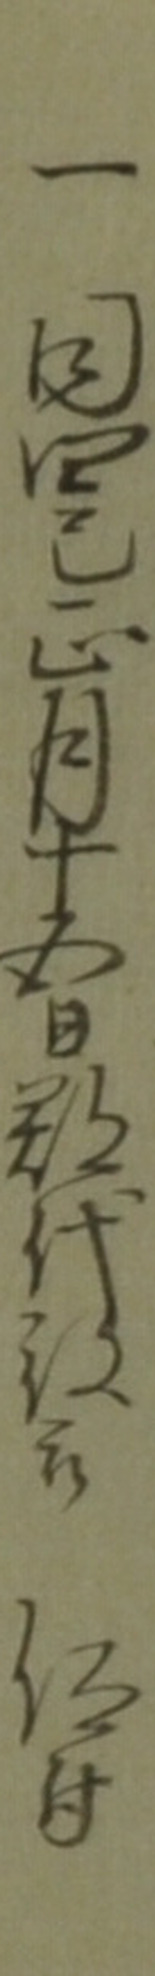一同四巳正月十五日郡代役被仰付
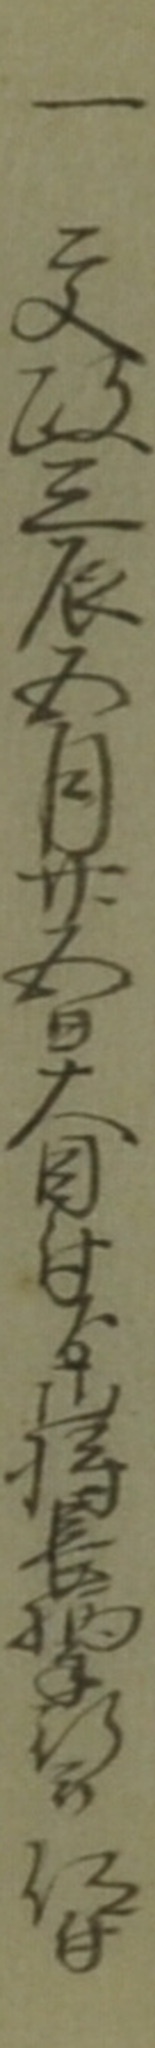一文政三辰五月廿五日大目付ゟ御持長柄奉行被仰付
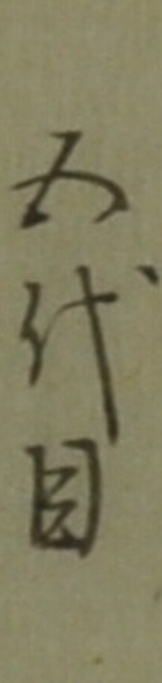五代目
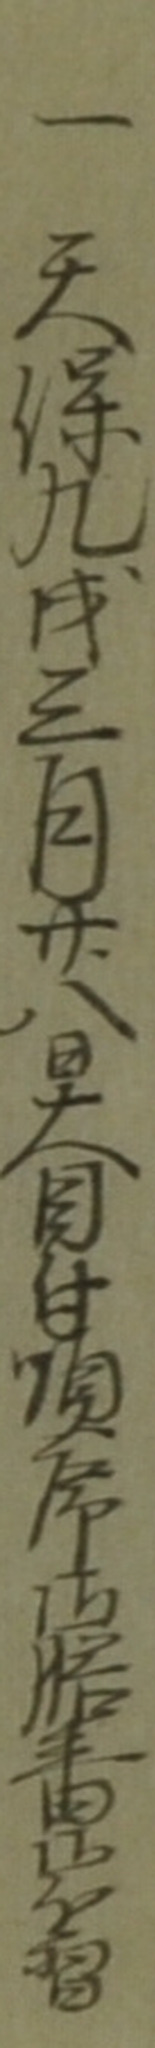一天保九戌三月廿八日大目付順席御膳番御近習
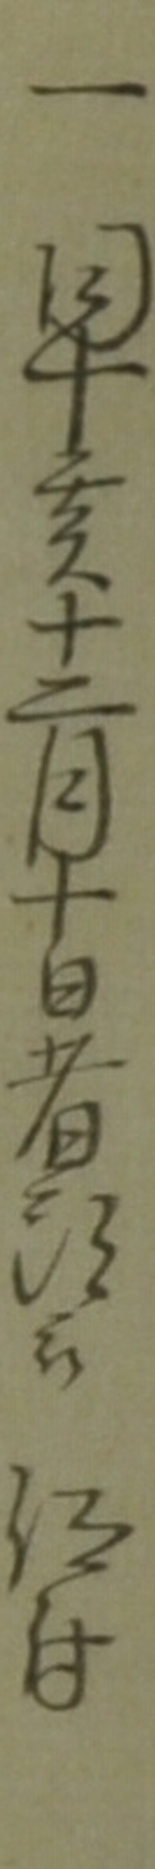一同十亥十二月十日者頭被仰付
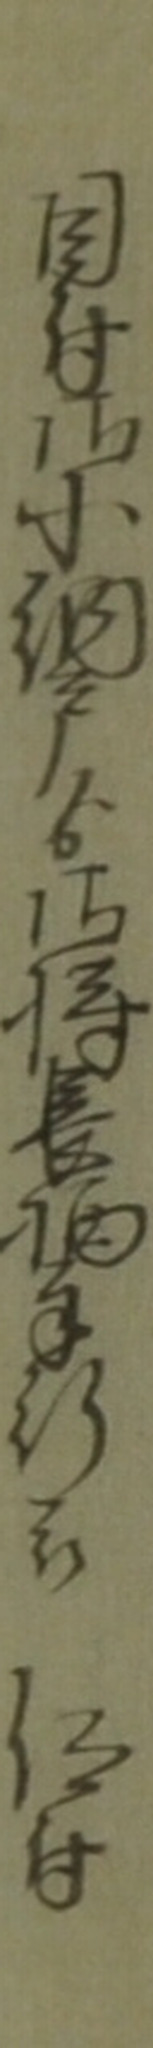目付御小納戸ゟ御持長柄奉行被仰付
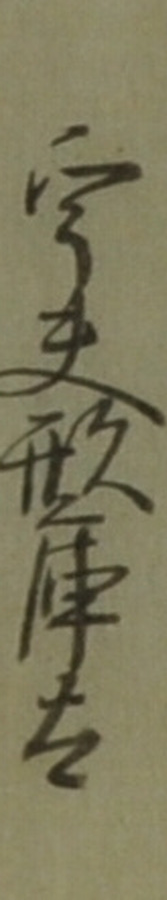宇夫形庫太
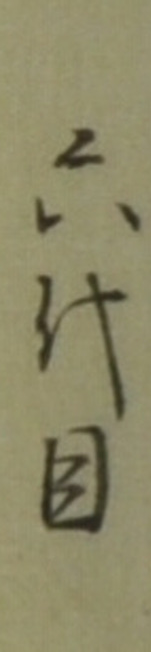六代目

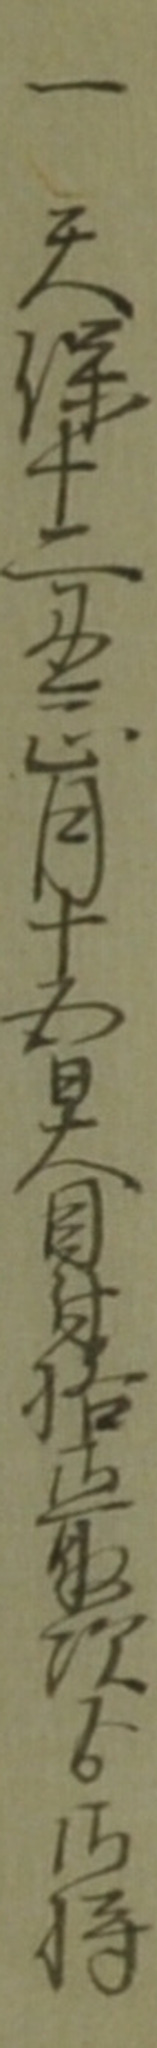一天保十二丑正月十五日大目付格御取次ゟ御持
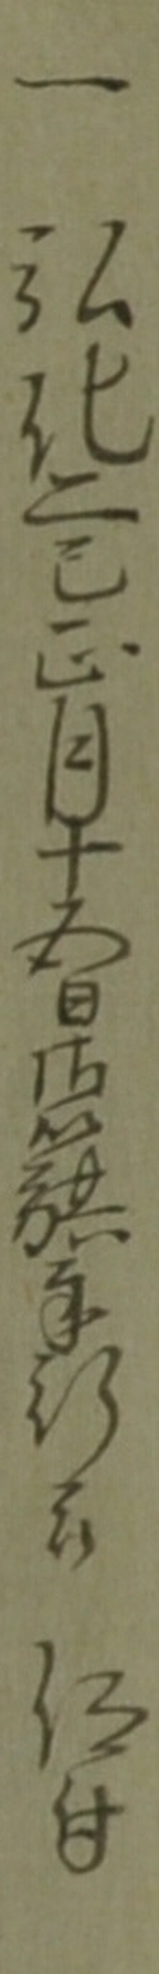一弘化二巳正月十五日御旗奉行被仰付
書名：諸御役代々録（三）
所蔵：伊那市立高遠町図書館・合同会社AMANE
